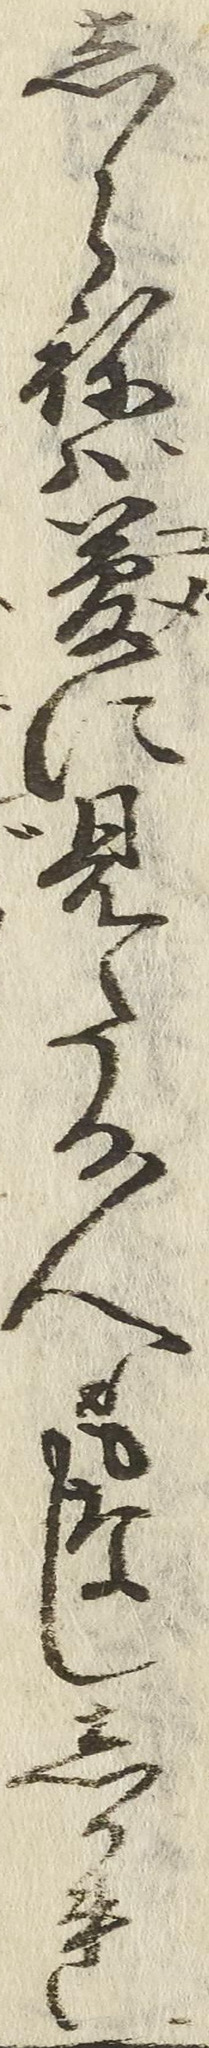しらねば夢に見たる人もなししかれ
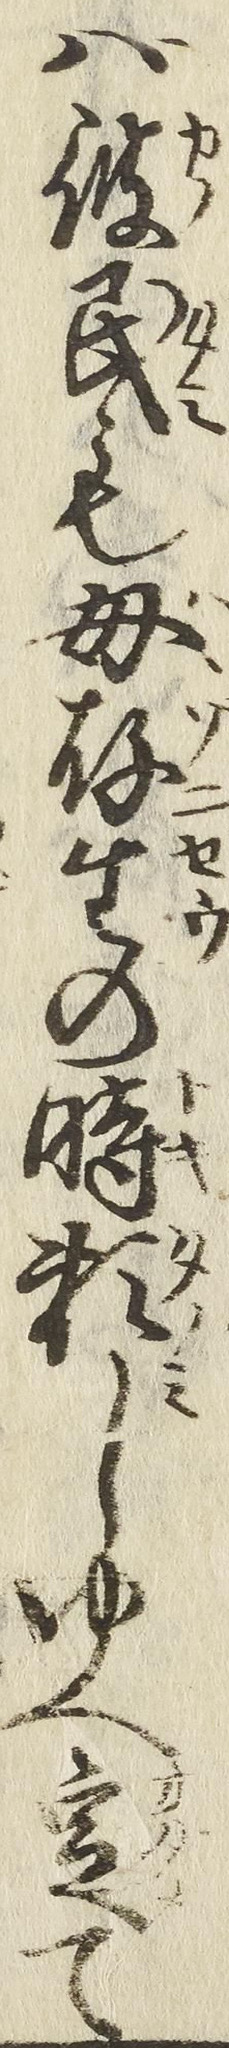ば彼民も母存生の時頼しゆへ定て
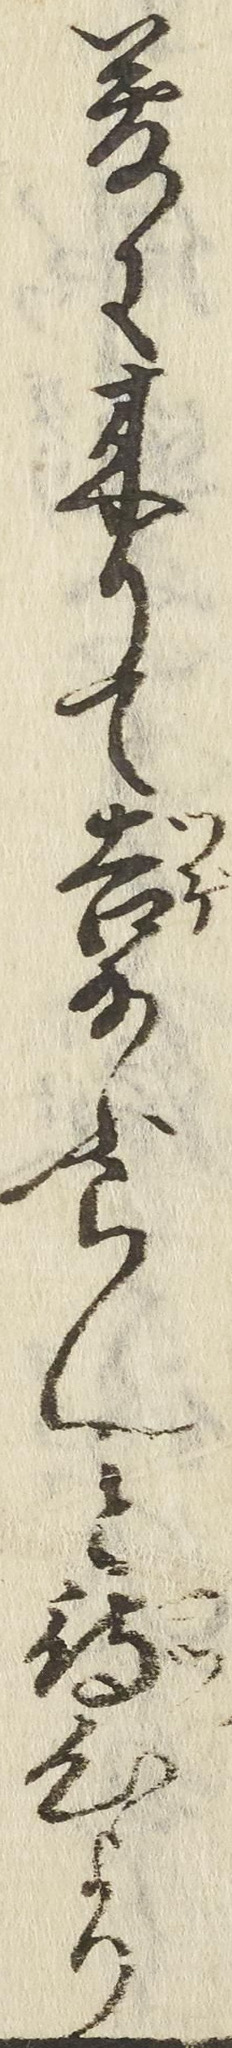夢に来りて告給ふらんと待心より
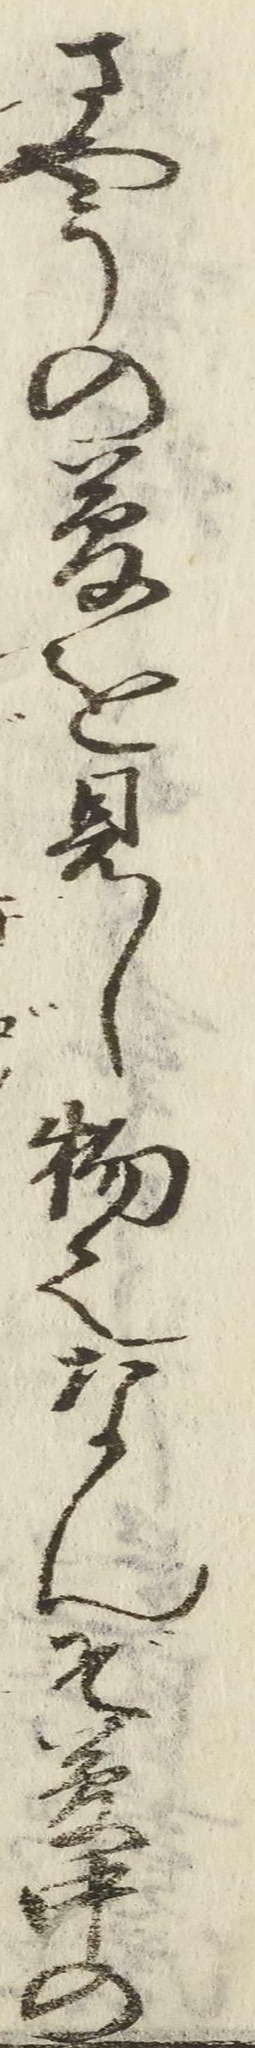さやうの夢を見し物也なんぞ夢中の
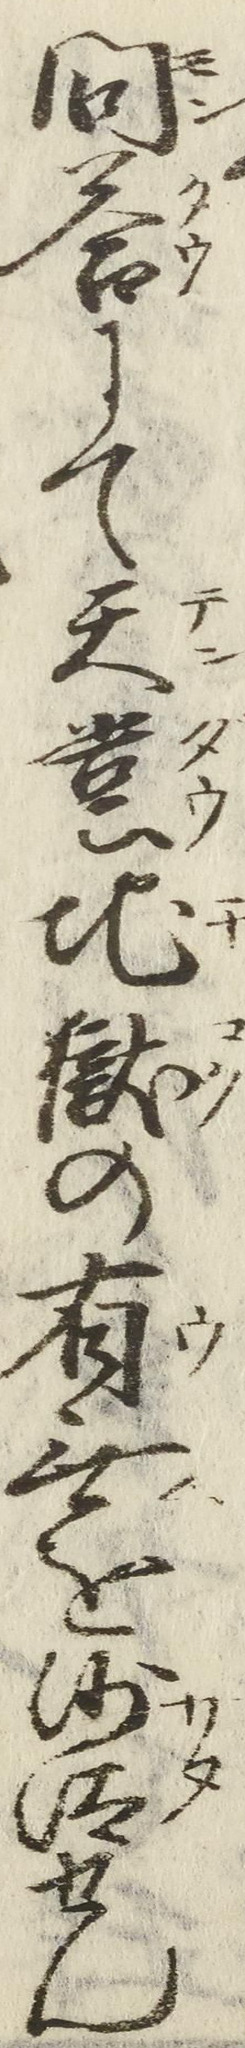問答にて天堂地獄の有無を沙汰せん
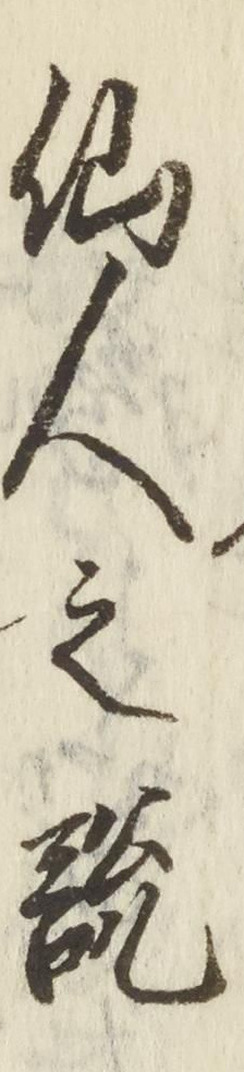仙人之説
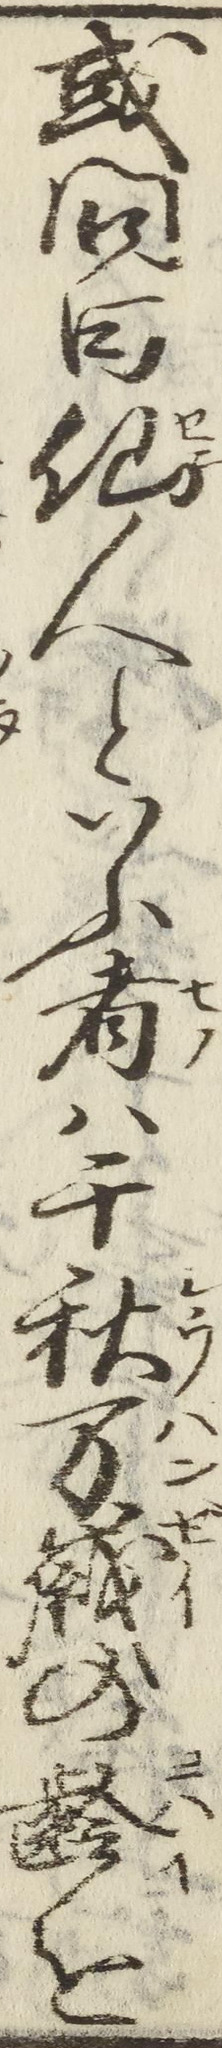或問曰仙人といふ者は千秋万歳の齢を
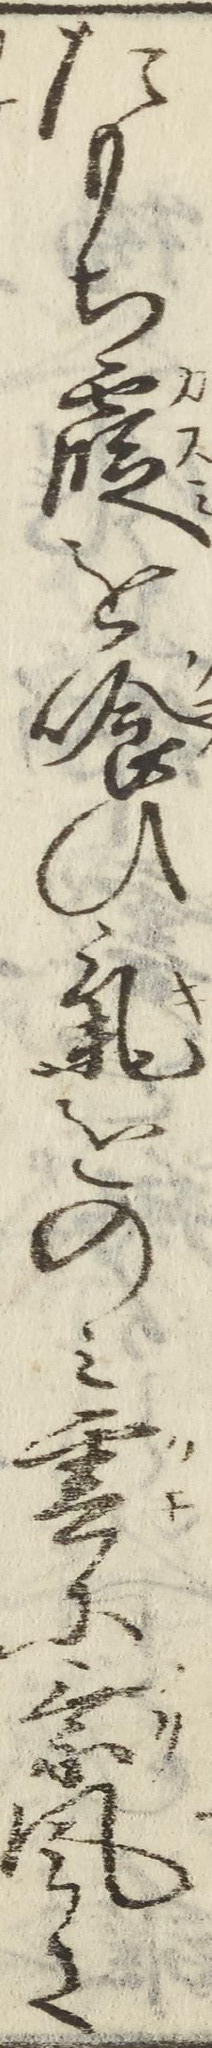たもち霞を喰ひ気をのみ雲に乗風に
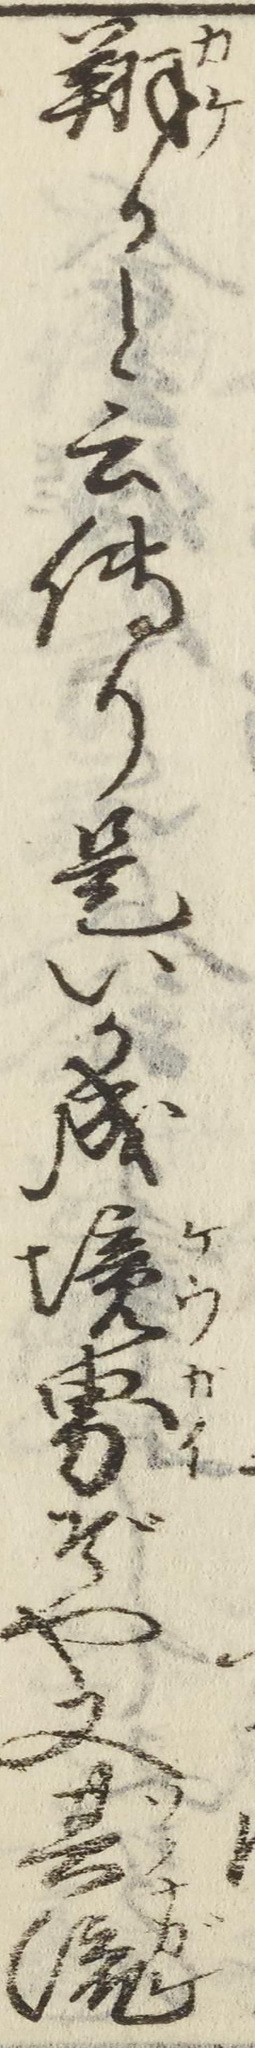翔ると云伝り是いか成境界ぞや其流
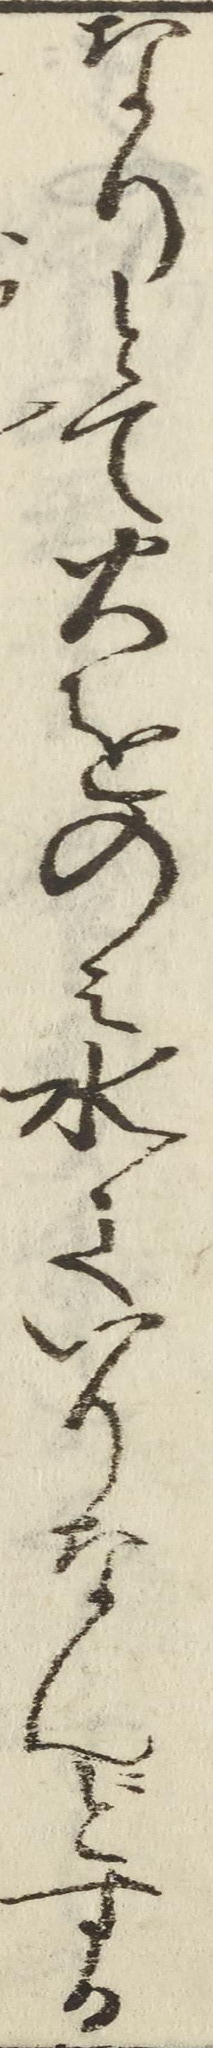なりとて火をのみ水にいりなんどする
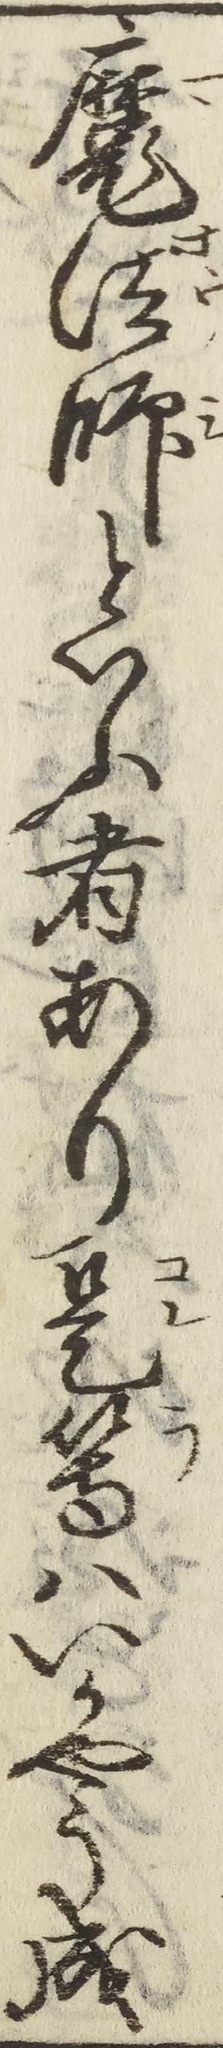魔法師といふ者あり是等はいかやう成

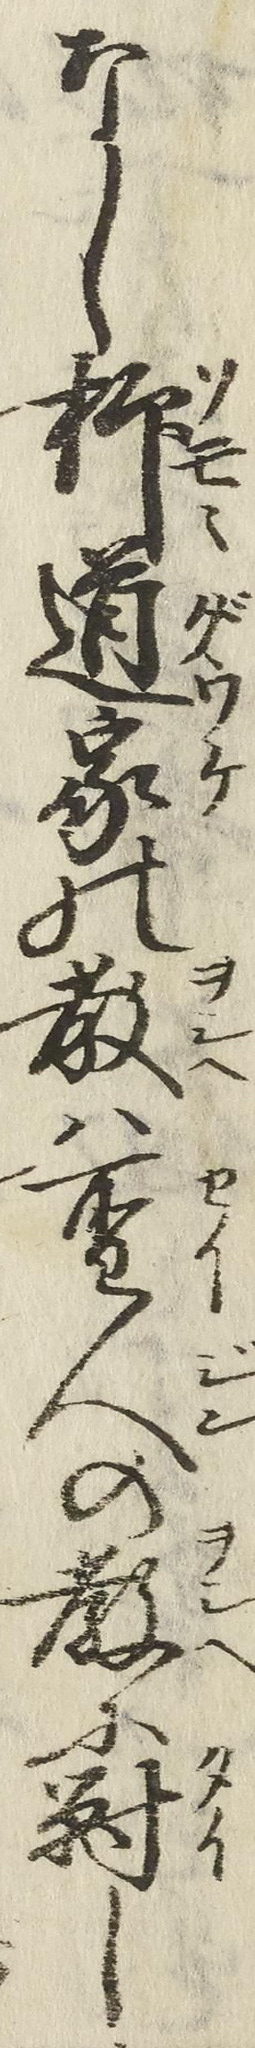なし抑道家の教は聖人の教に対し
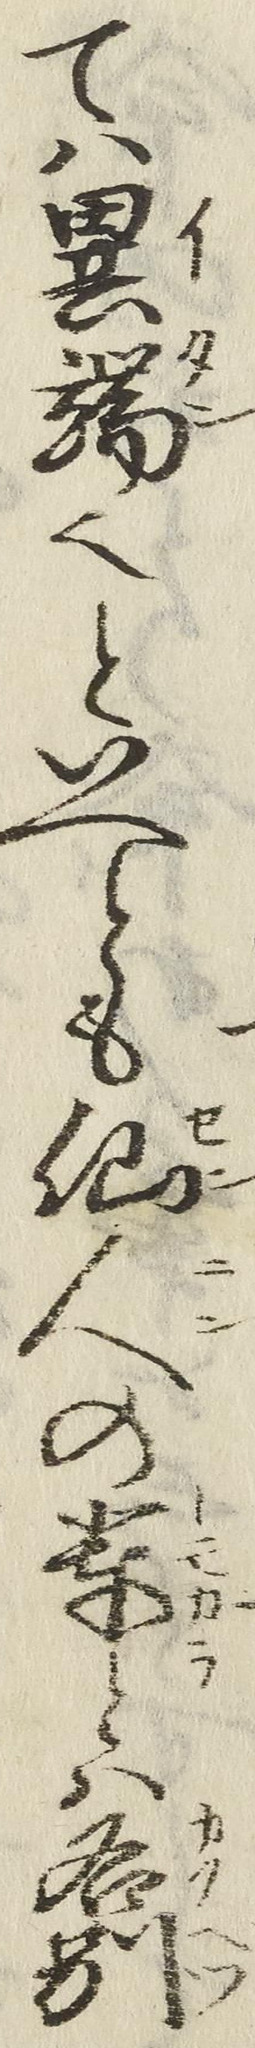ては異端也といへとも仙人の輩とは各別
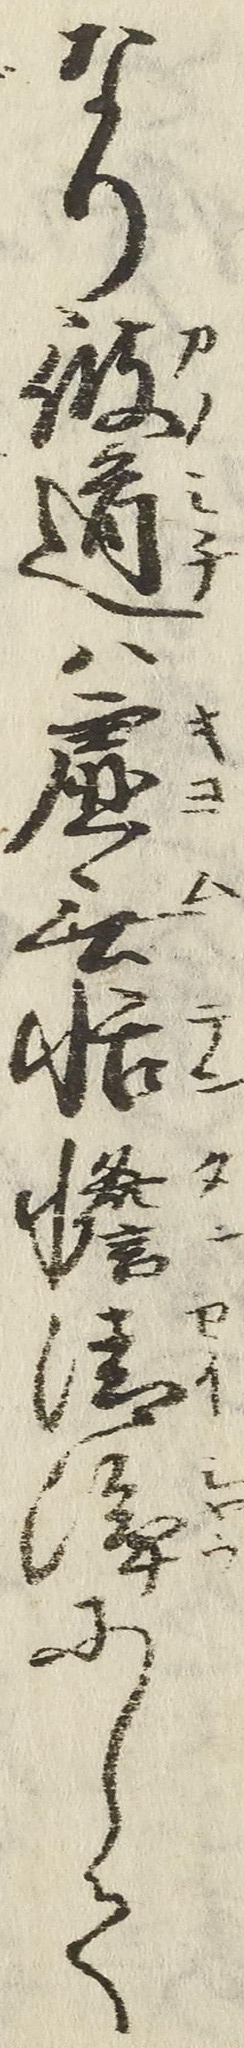なり彼道は虚無恬憺清浄にして
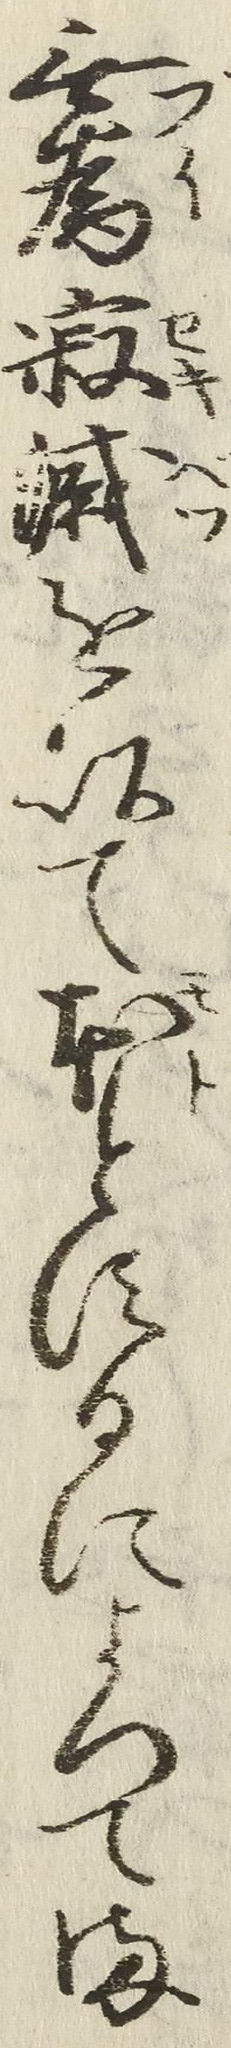無為寂滅を以て本とするによつてま
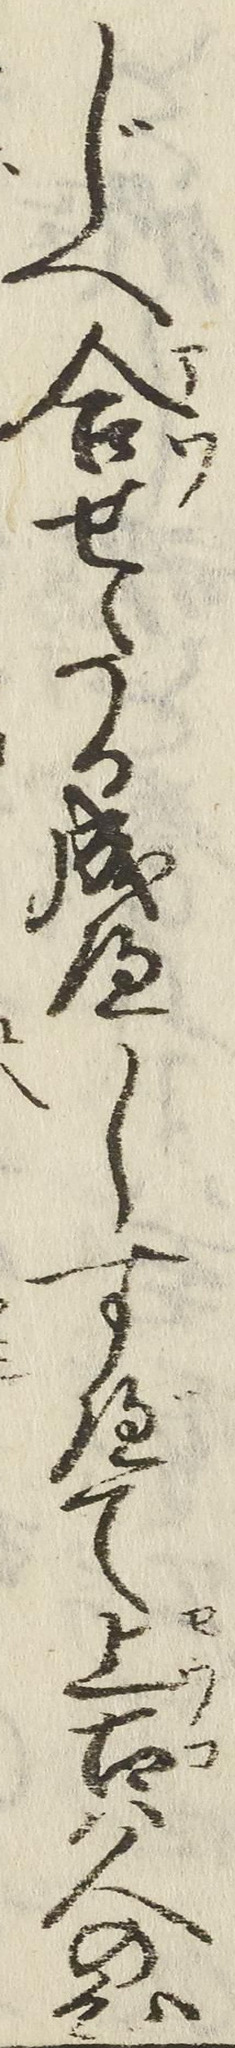じへ合せたる成へしすべて上古は人の心
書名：天地或問珍　地
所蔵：東京大学地震研究所図書室 Earthquake Research Institute Library, The University of Tokyo, JAPAN
